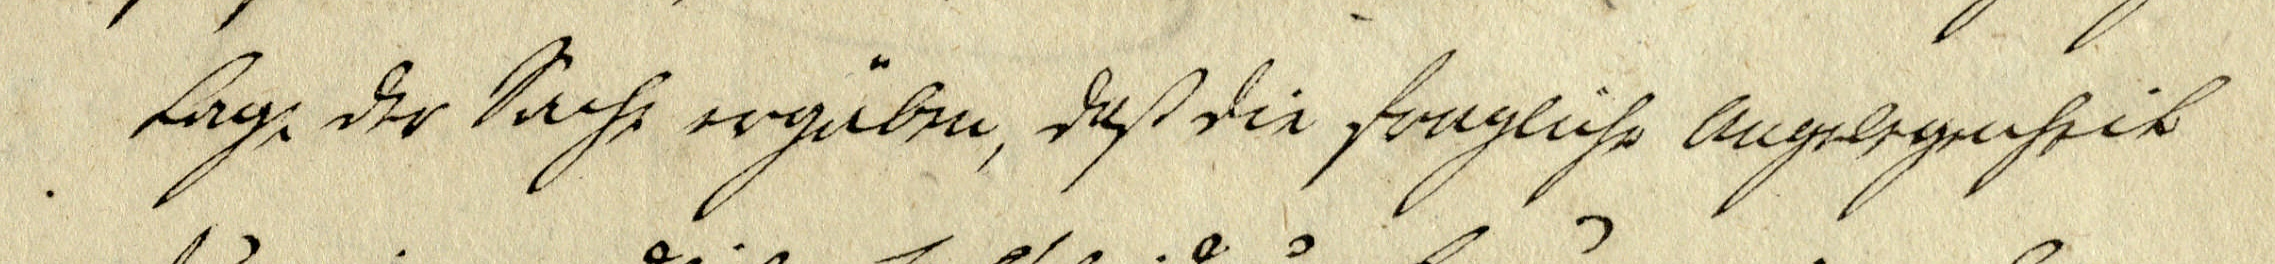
Lage der Sache ergäben, daß die fragliche Angelegenheit
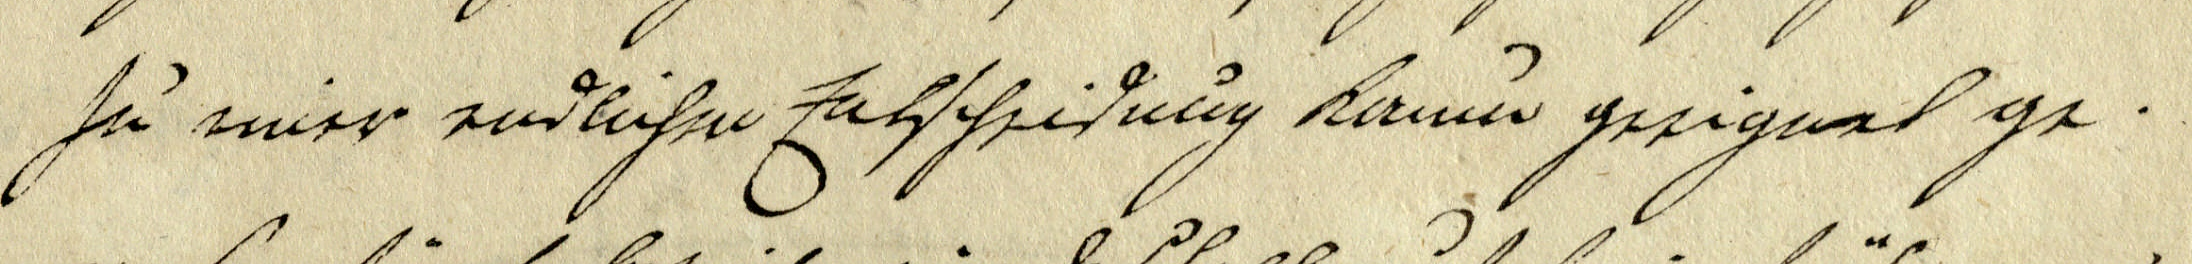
zu einer endlichen Entscheidung kaum geeignet ge¬
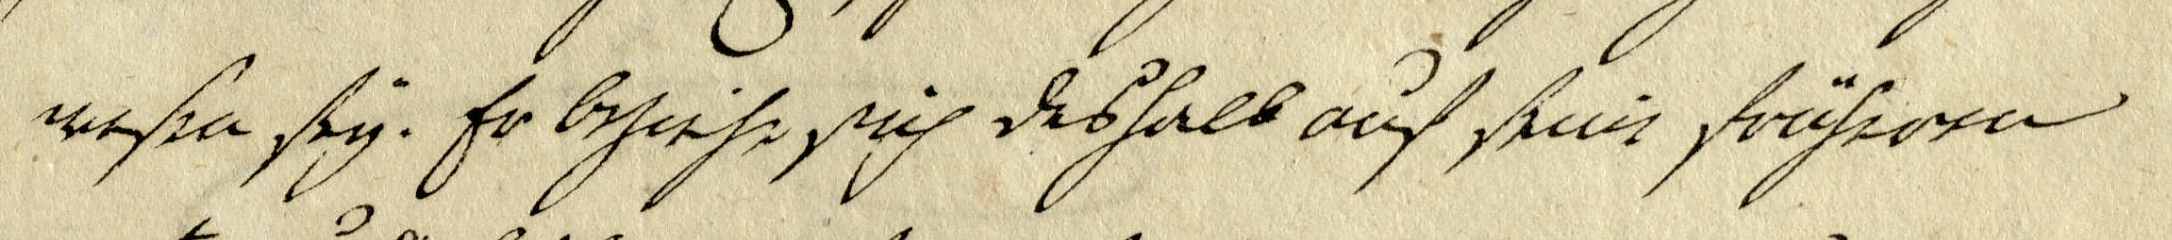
wesen seÿ. Er beziehe sich deshalb auf seine früheren
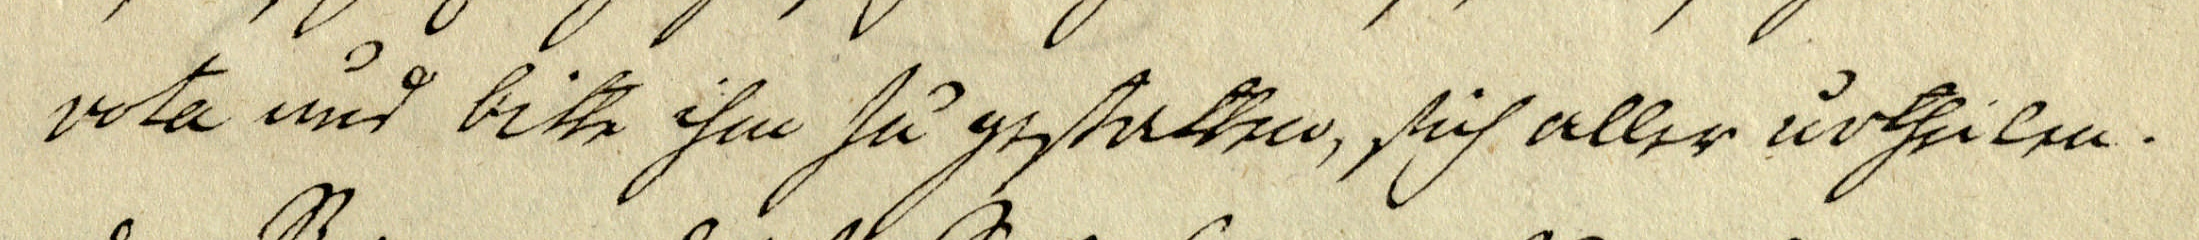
vota und bitte ihm zu gestatten, sich aller urtheilen¬
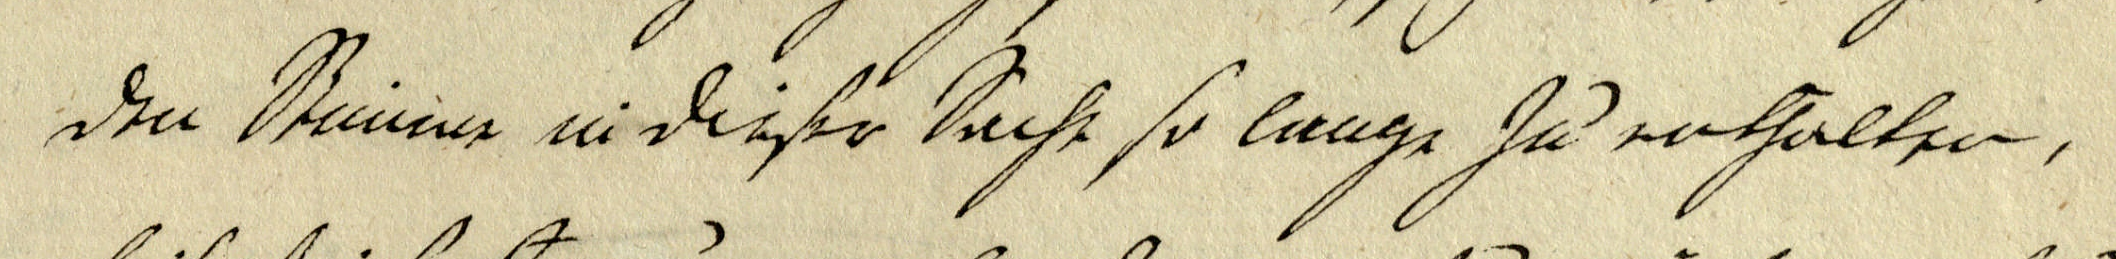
den Stimme in dieser Sache so lange zu enthalten,
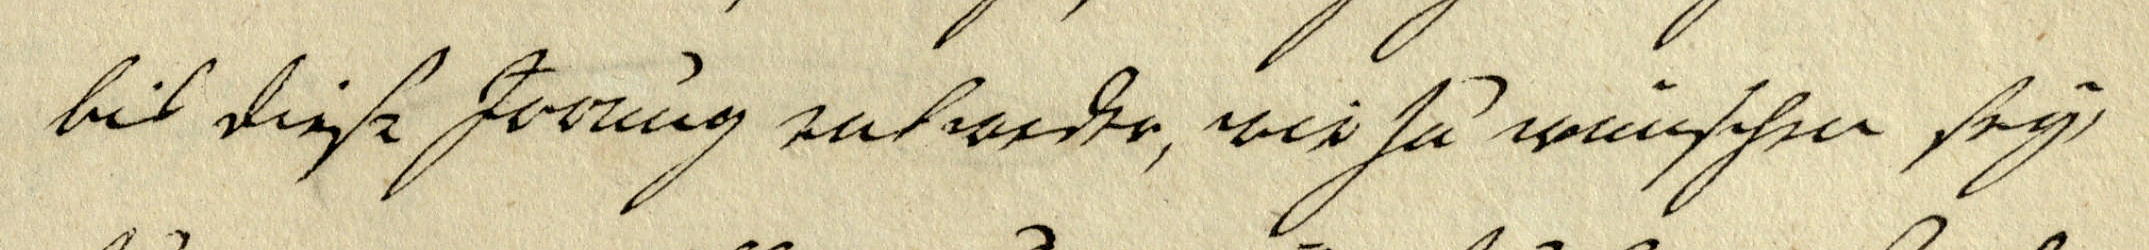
bis diese Irrung entweder, wie zu wünschen seÿ,
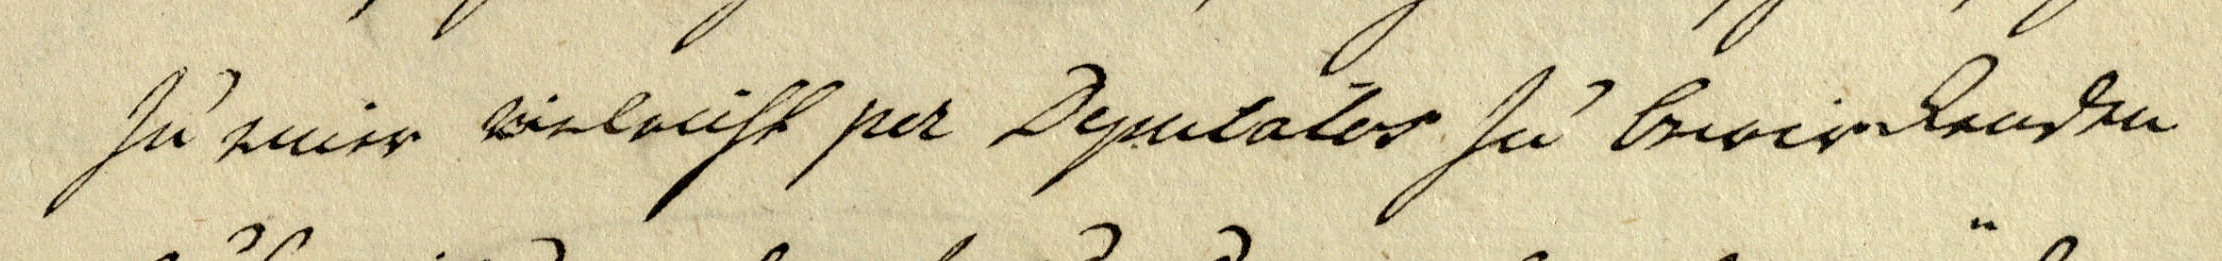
zu einer vieleicht per Deputatos zu bewirkenden
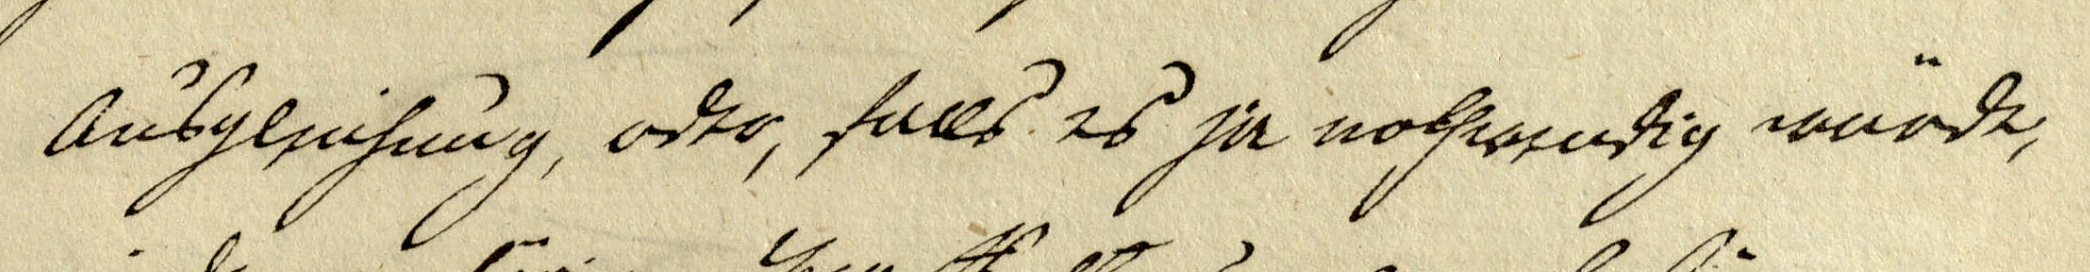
Ausgleichung, oder, falls es ja nothwendig würde,
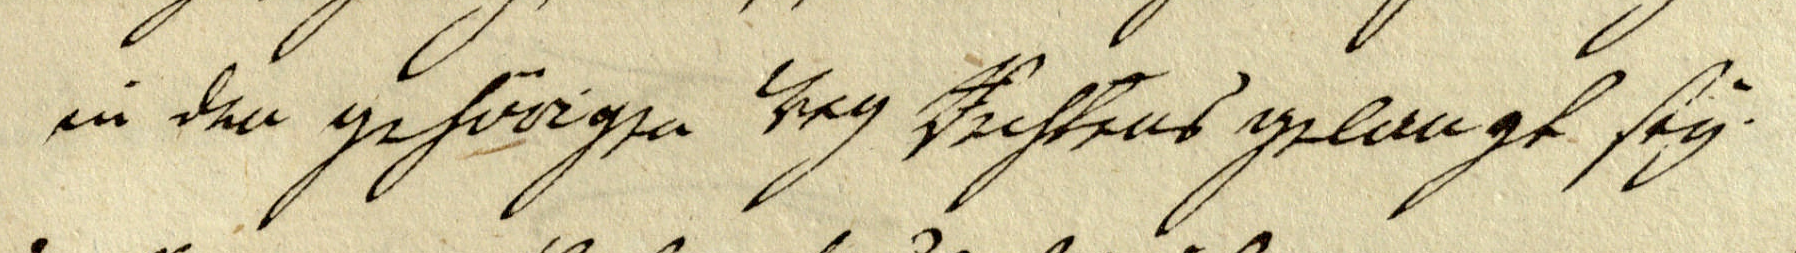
in den gehörigen Weg Rechtens gelangt seÿ.
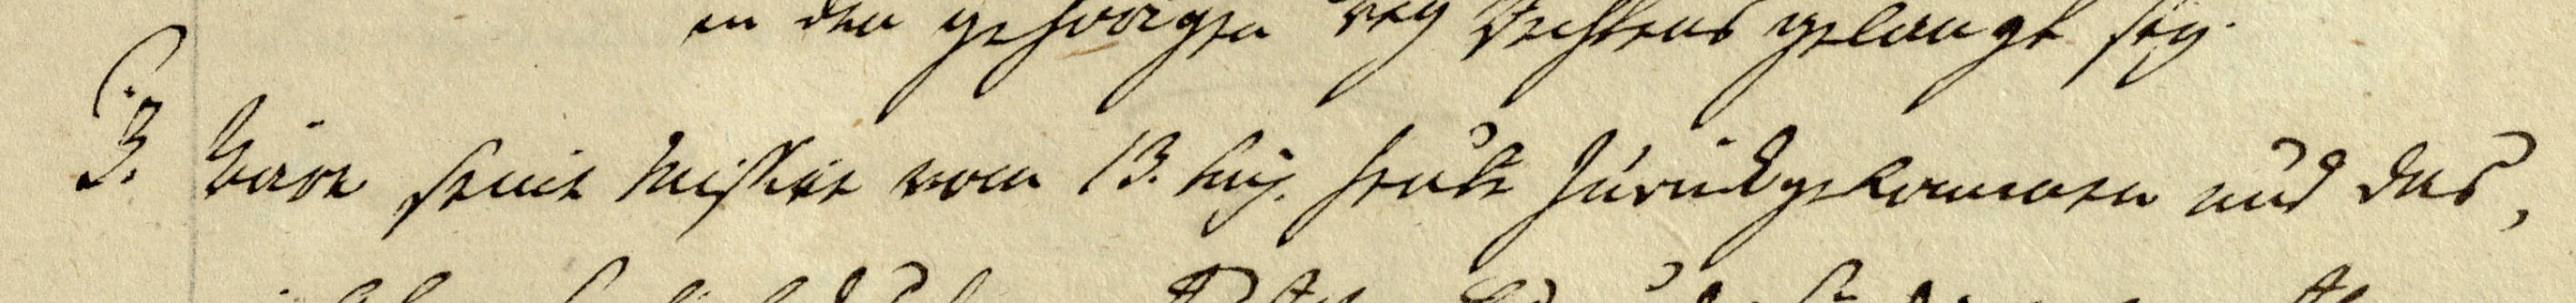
3. Wäre seine Missive vom 13. huj. heute zurückgekommen und das
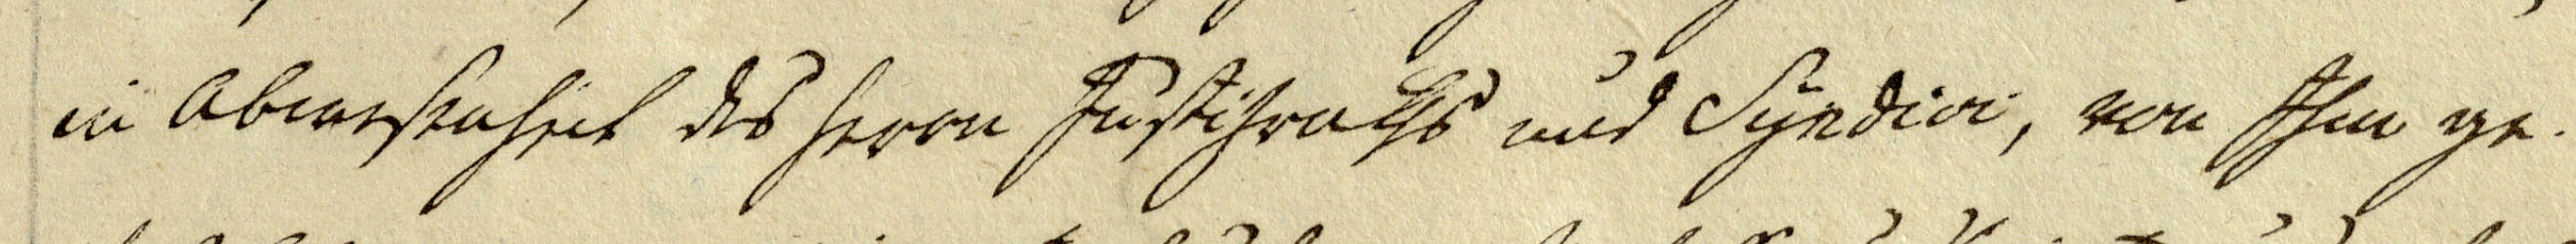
in Abwesenheit des Herrn Justizraths und Sÿndici, von Ihm ge¬
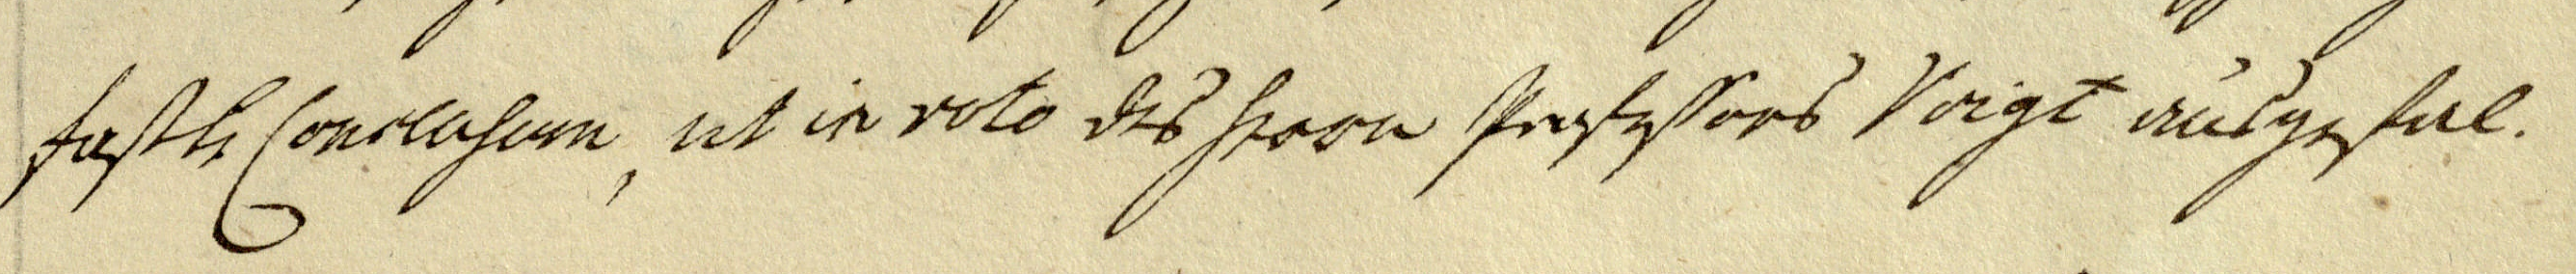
faßte Conclusum, ut in voto des Herrn Professors Voigt ausgefal¬
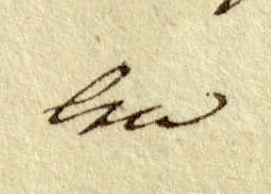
len
